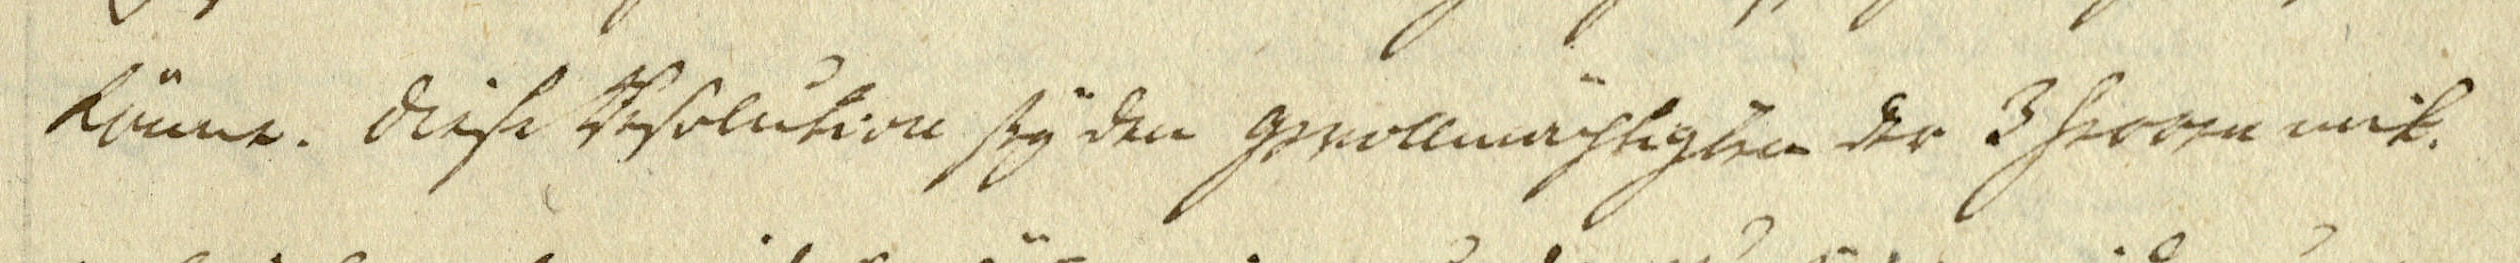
könne. Diese Resolution seÿ dem Gevollmächtigten der 3 Herren mit¬
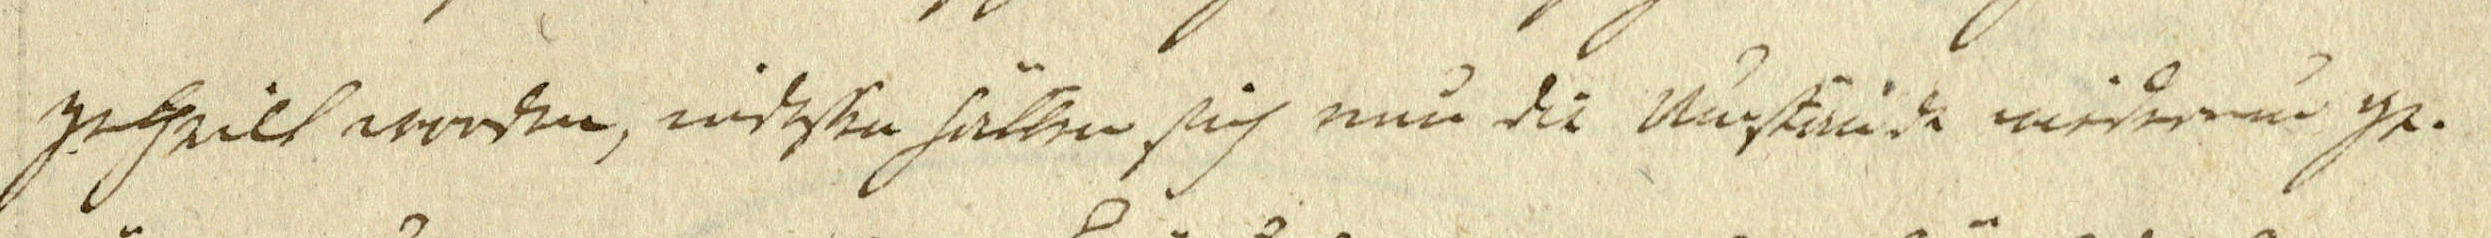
getheilt worden, indessen hätten sich nun die Umstände wiederum ge¬
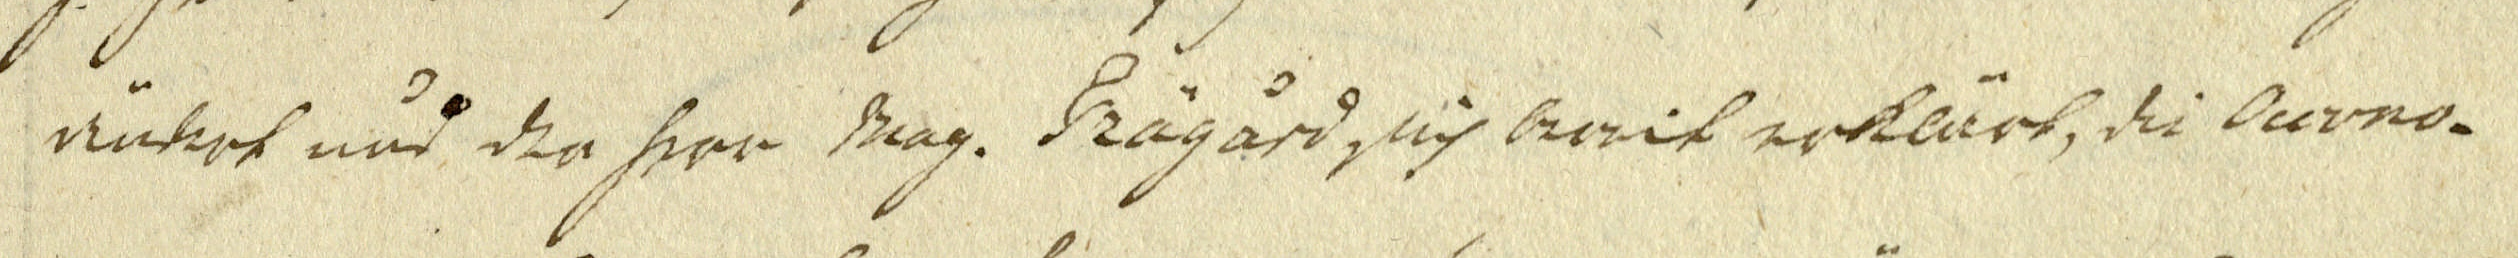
ändert und der Herr Mag. Trägård sich bereit erklärt, die Oecono¬
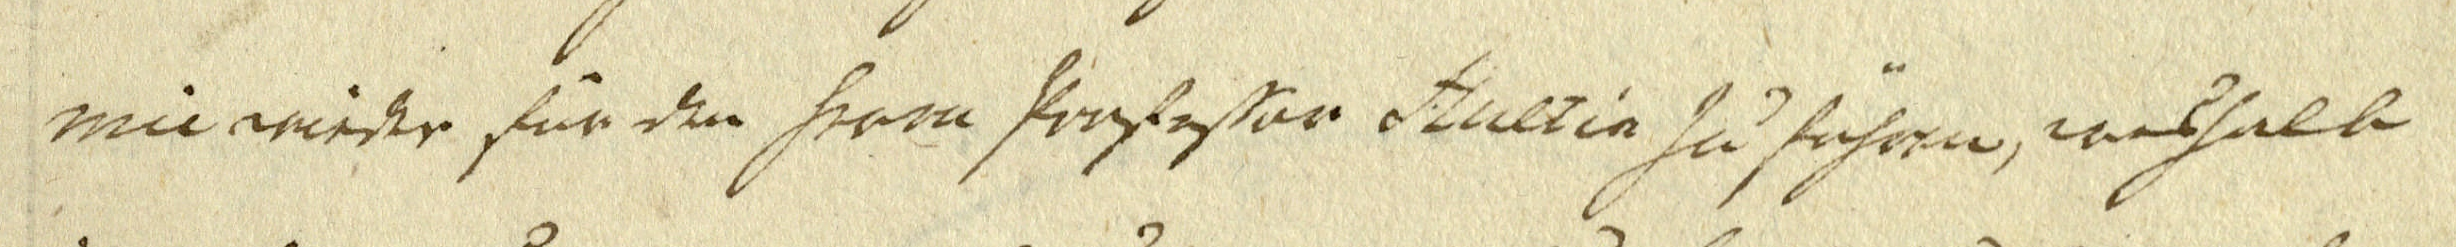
mie wieder für den Herrn Professor Hultén zu führen, weshalb
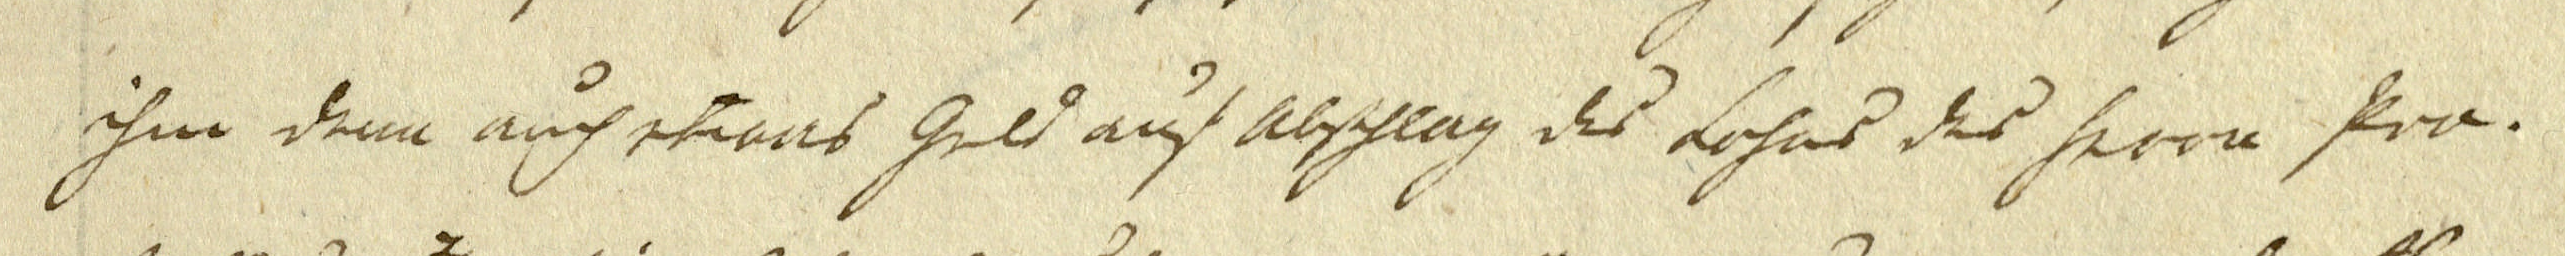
ihm denn auch etwas Geld auf Abschlag des Lohns des Herrn Pro¬
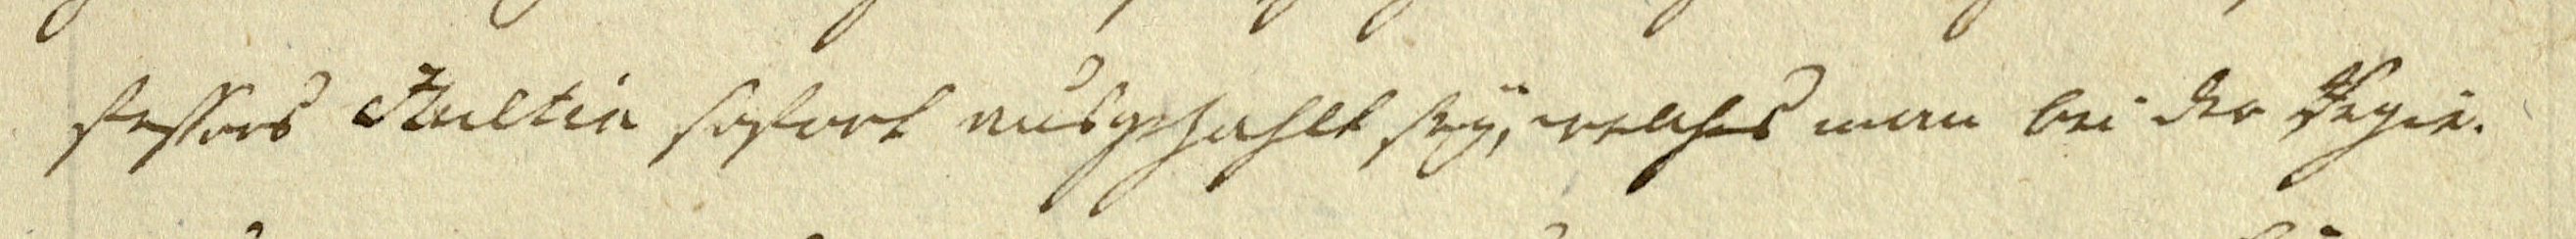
fessors Hultén sofort ausgezahlt seÿ, welches man bei der Regie¬
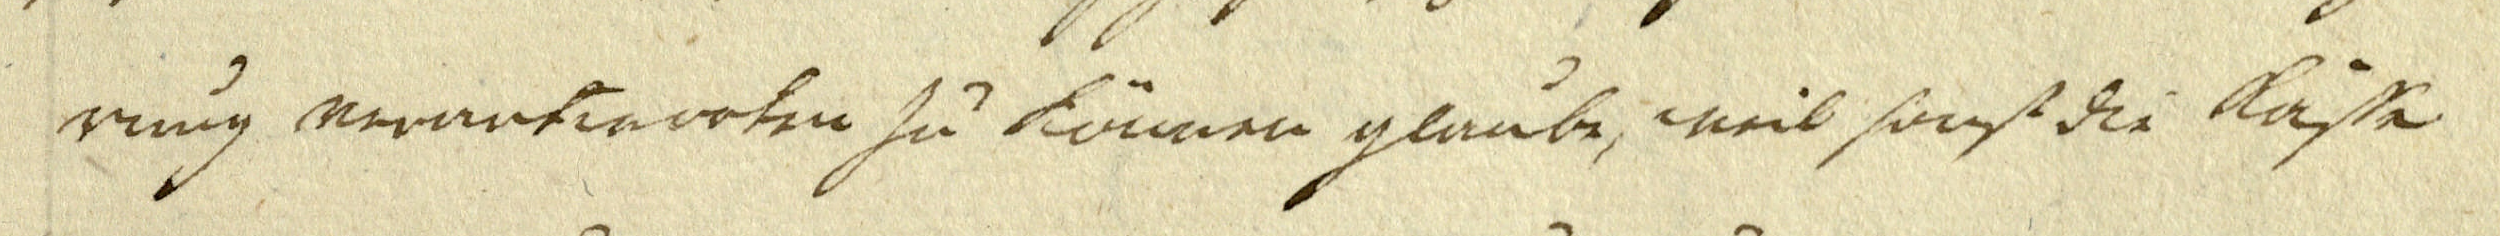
rung verantworten zu können glaube, weil sonst die Kasse
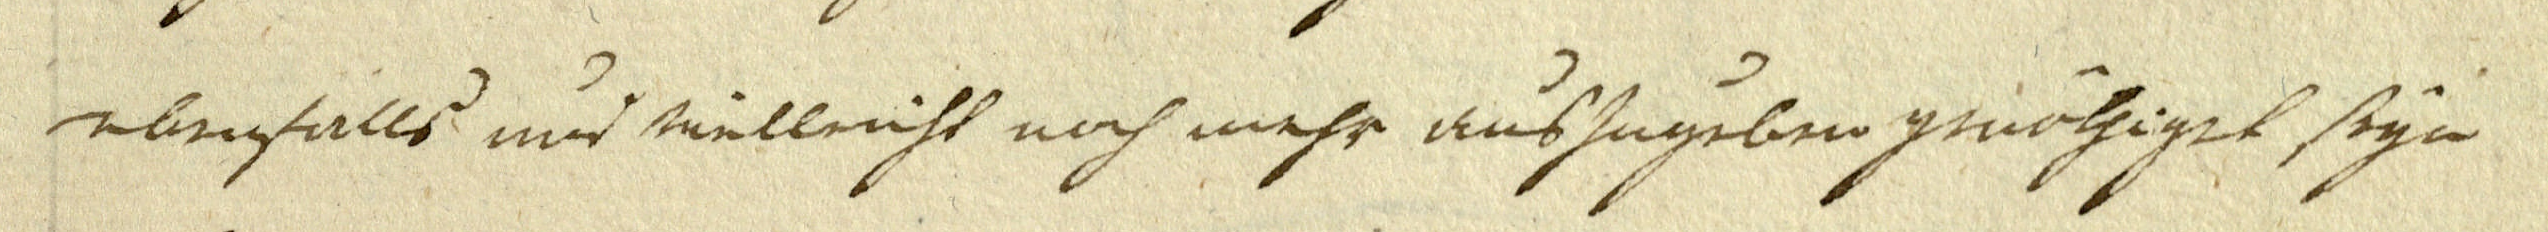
ebenfalls und vielleicht noch mehr auszugeben genöthiget seÿn
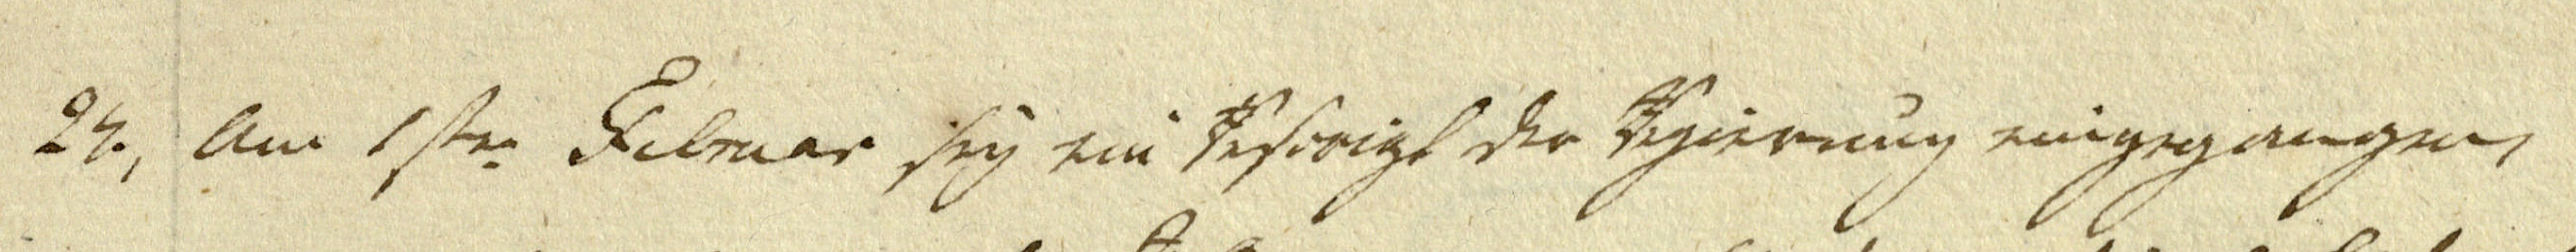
24., Am 1sten Februar seÿ ein Rescript der Regierung eingegangen,
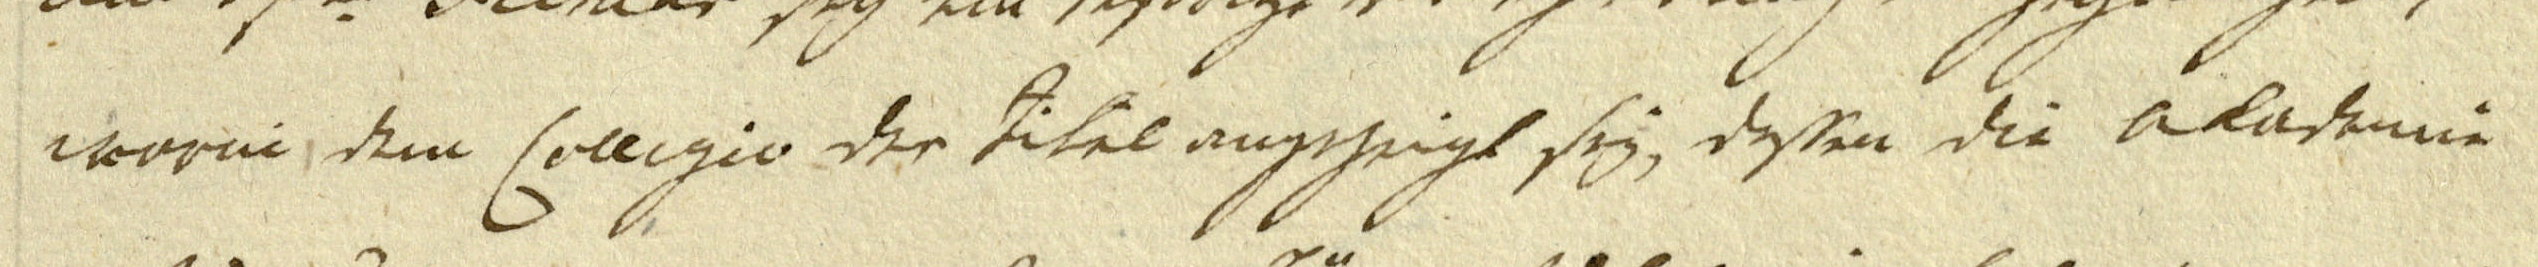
worin dem Collegio der Titel angezeigt seÿ, dessen die Akademie
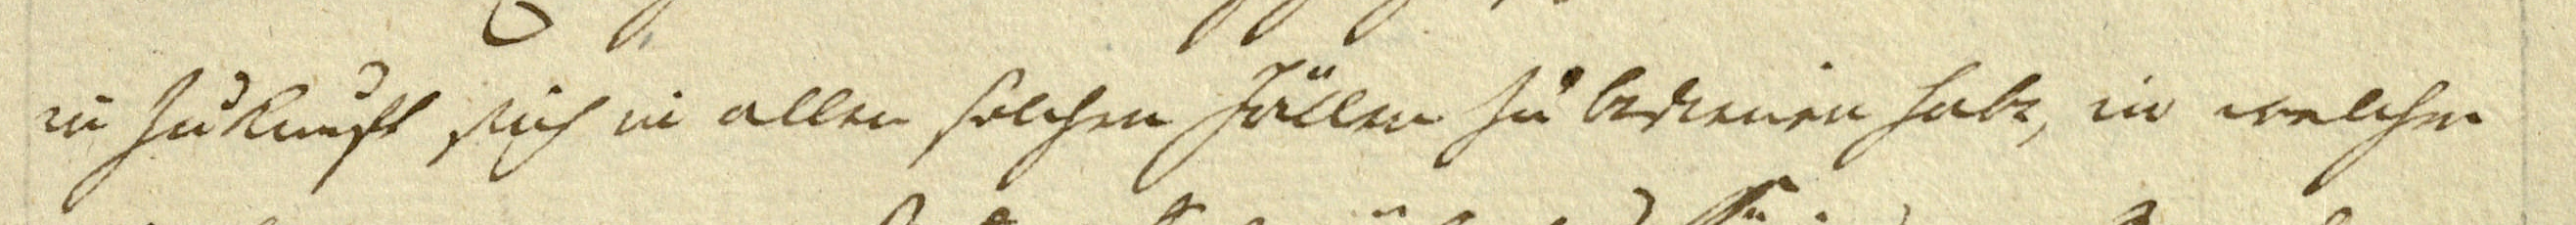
in Zukunft sich in allen solchen Fällen zu bedienen habe, in welchen
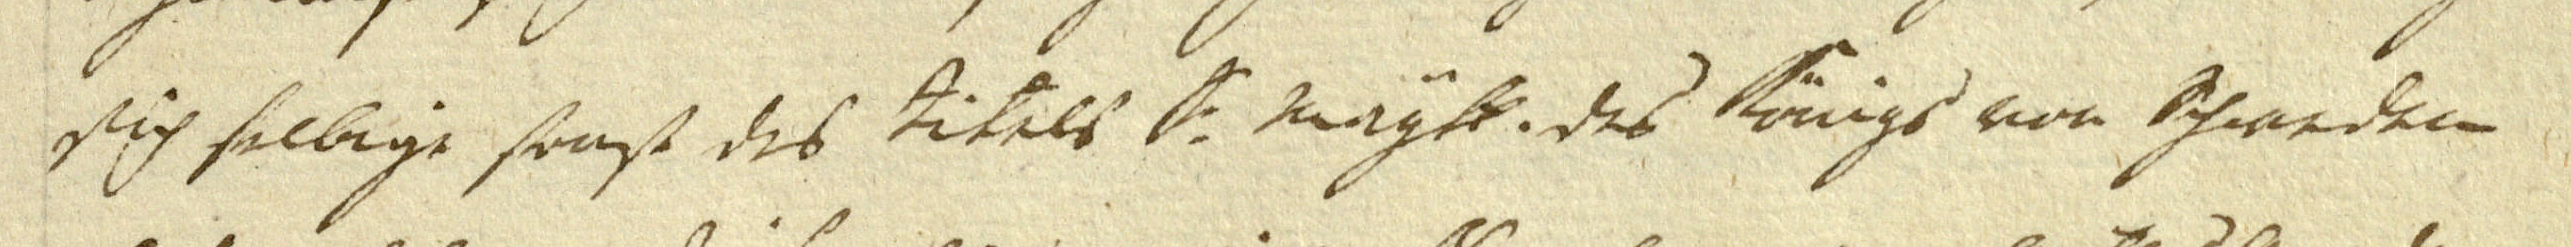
sich selbige sonst des Titels Sr. Maÿtt. des Königs von Schweden
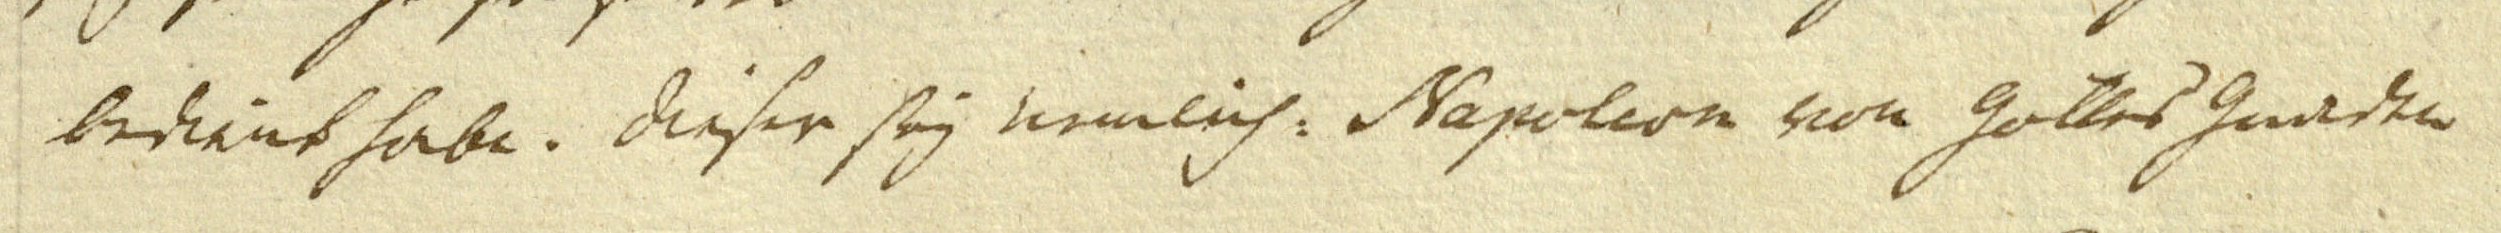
bedient habe. Dieser seÿ nemlich: Napoleon von Gottes Gnaden
